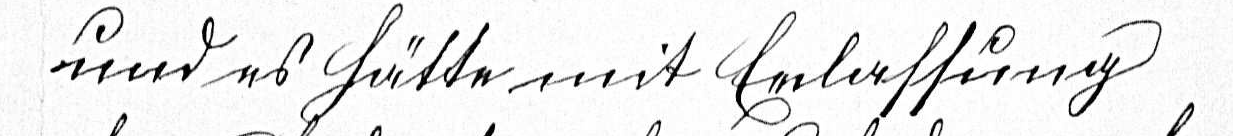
und es hätte mit Erlassung
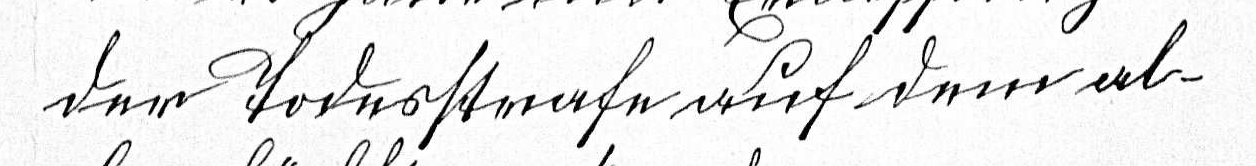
der Todesstrafe auf dem al¬
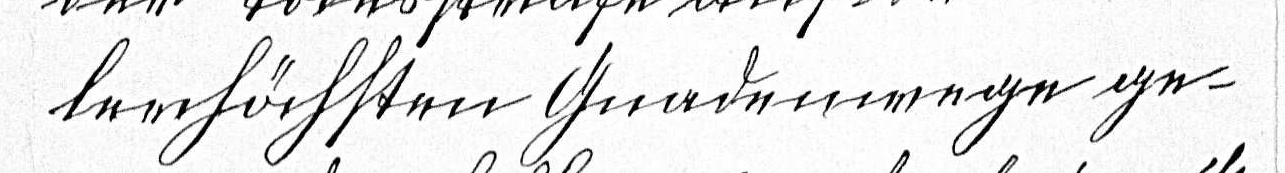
lerhöchsten Gnadenwege ge¬
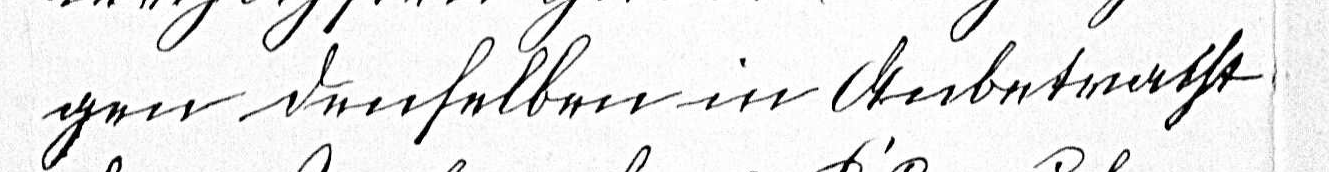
gen denselben in Anbetracht
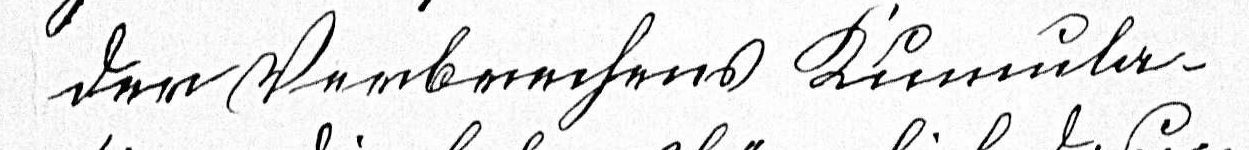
der Verbrechens Kumula¬
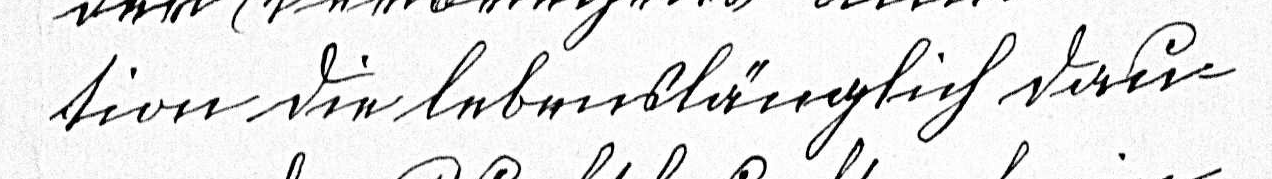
tion die lebenslänglich dau¬
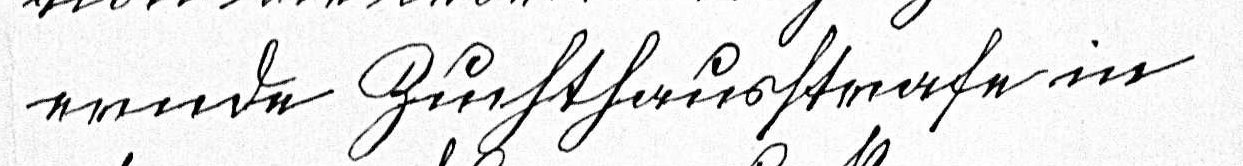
ernde Zuchthausstrafe in
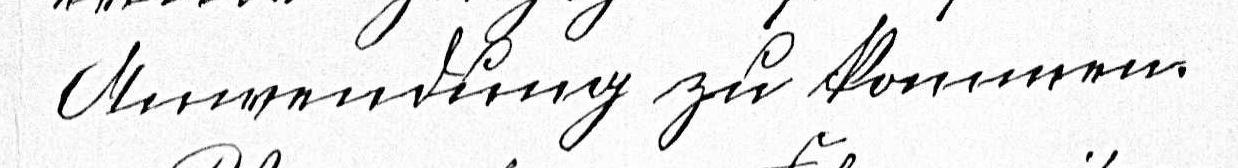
Anwendung zu kommen.
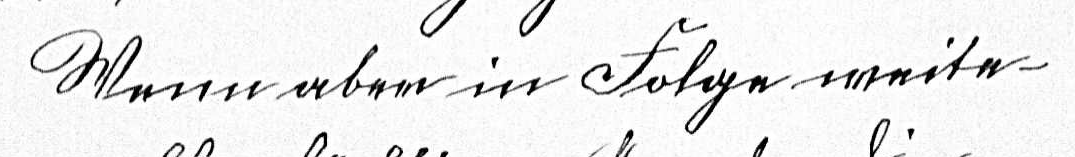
Wenn aber in Folge weite¬
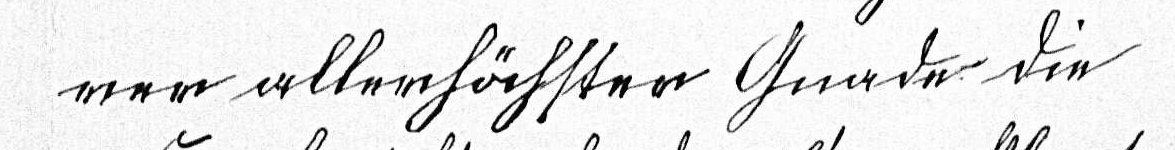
rer allerhöchster Gnade die
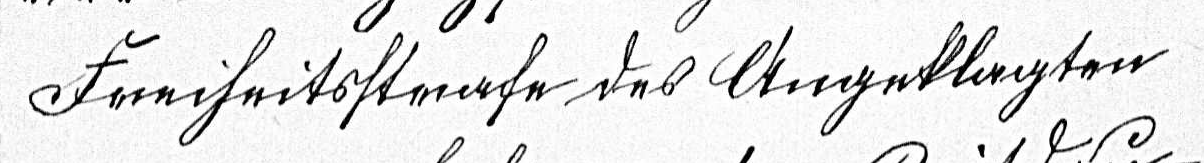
Freiheitstrafe des Angeklagten
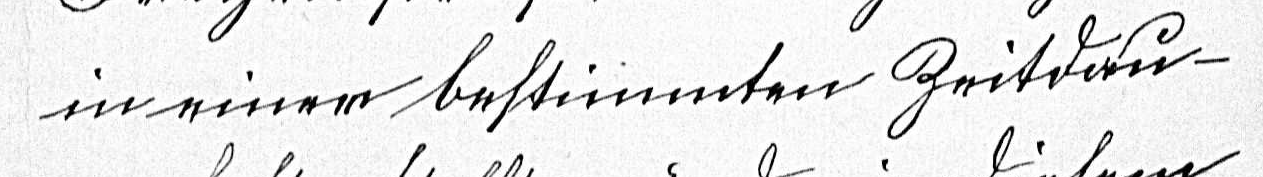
in einer bestimmten Zeitdau¬
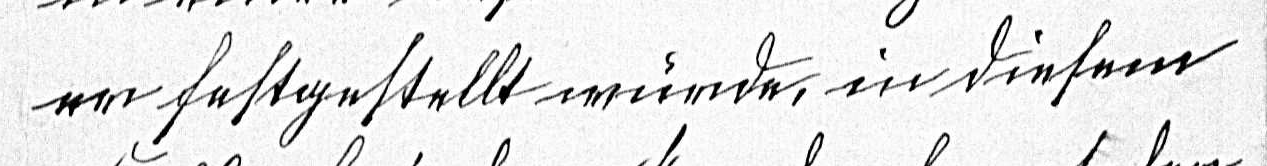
er festgestellt würde, in diesem
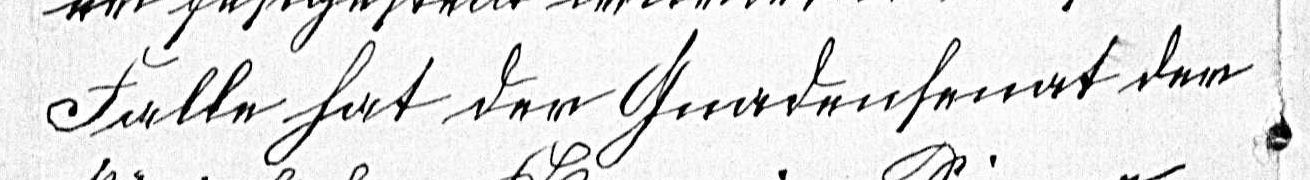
Falle hat der Gnadensenat der
